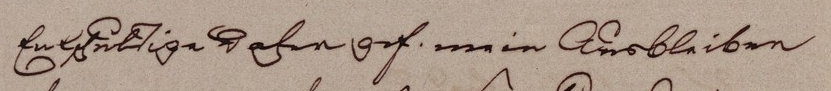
Entschuldige daher gef. mein Ausbleiben
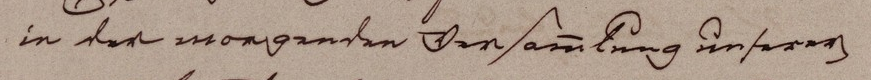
in der morgenden Versammlung unserer
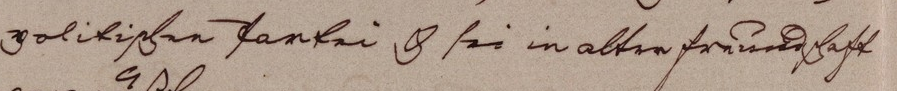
politischen Partei & sei in alter Freundschaft
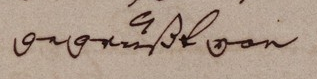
gegrüßt von
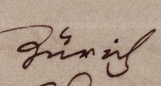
Zürich
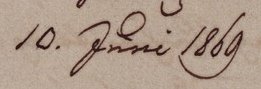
10. Juni 1869
